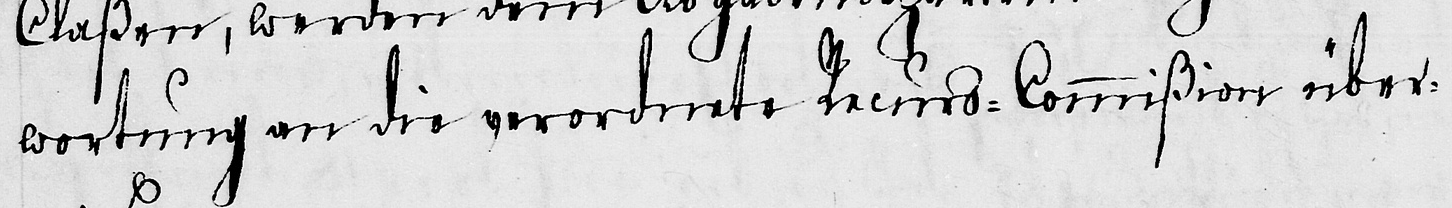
wortung an die verordnete Recurs-Commißion über¬
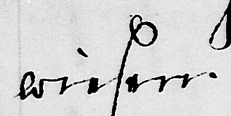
wiesen.
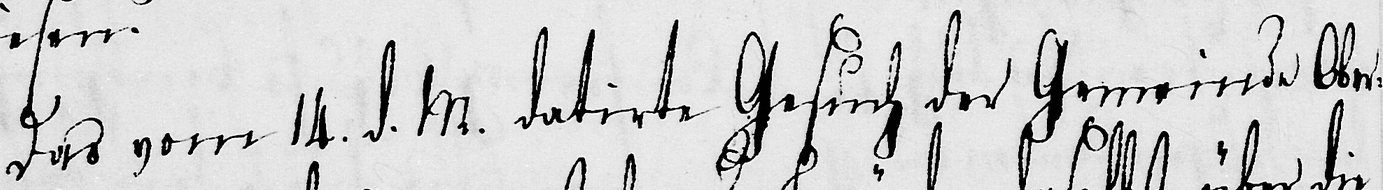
Das vom 14. d. M. datirte Gesuch der Gemeinde Obe¬
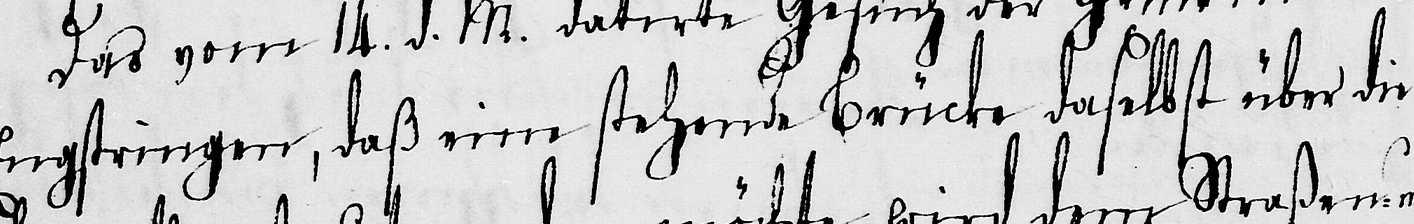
ngstringen, daß eine stehende Brücke daselbst über die
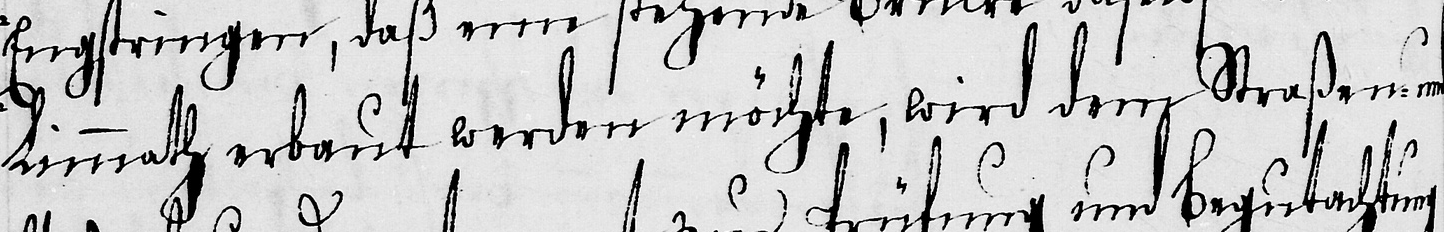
Limmath erbaut werden möchte, wird dem Straßen-
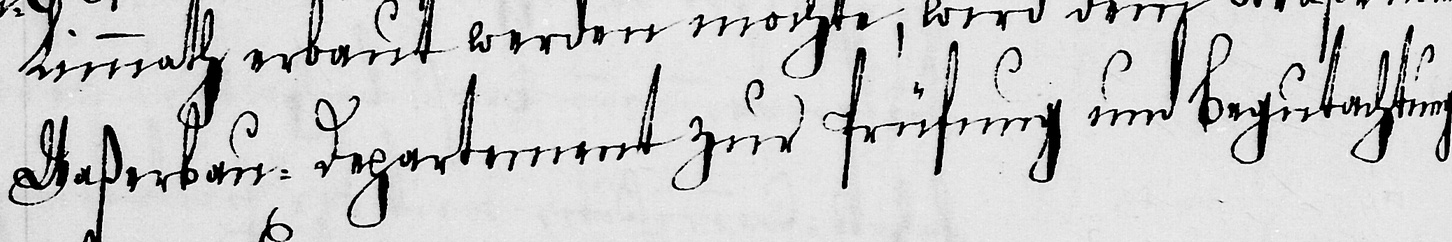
Waßerbau-Departement zur Prüfung und Begutachtu¬
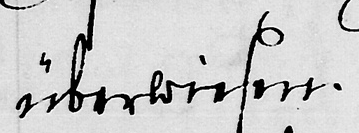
überwiesen.
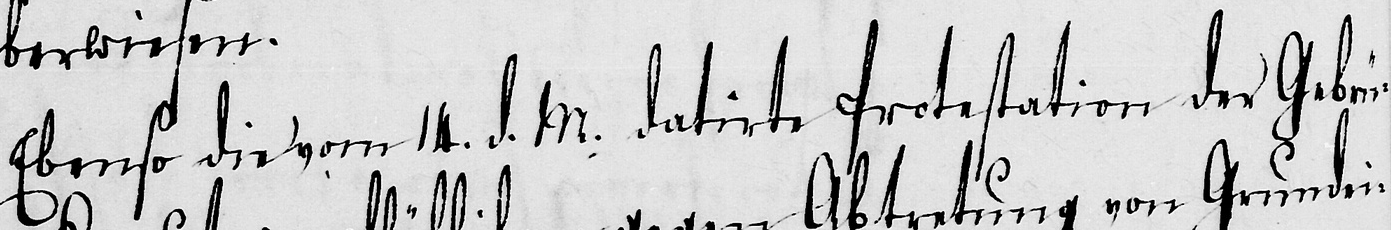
Ebenso die vom 14. d. M. datirte Protestation der Gebrü¬
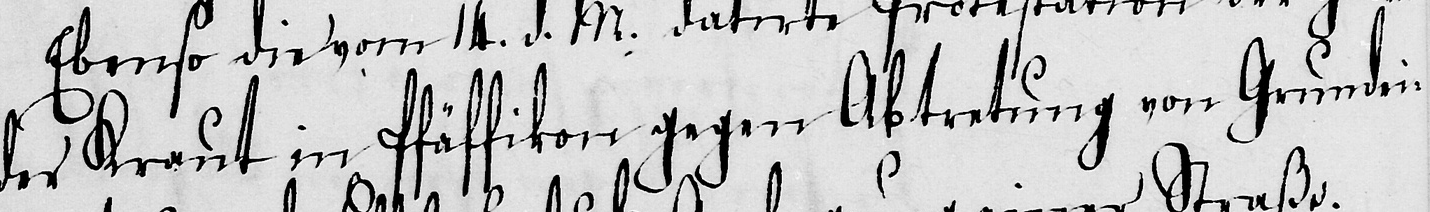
der Kraut in Pfäffikon gegen Abtretung von Grundei¬
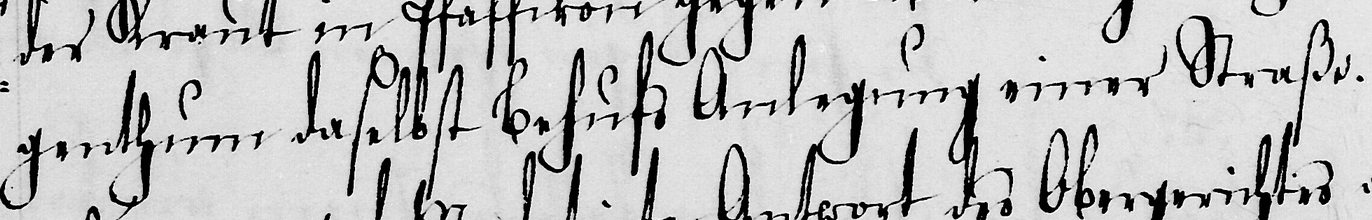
genthum daselbst Behufs Anlegung einer Straße.
